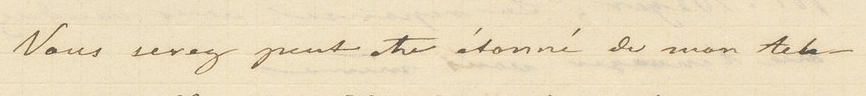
Vous serez peut-etre étonné de mon tele-
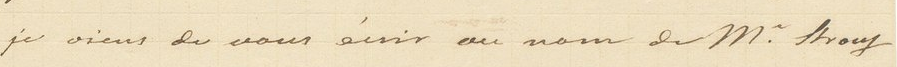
je viens de vous écrir au nom de MrStrous-
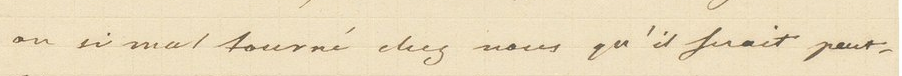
on si mal tourné chez nous qu'il ferait peut-
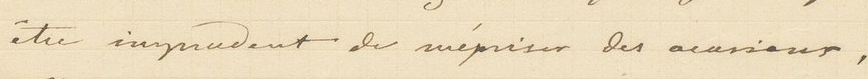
être imprudent de mépriser des ocasions,
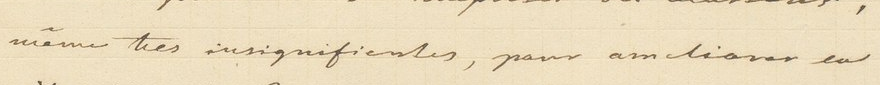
même tres insignifiantes, pour ameliorer la
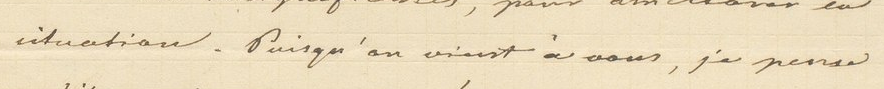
situation. Puisqu'on vient à vous, je pense
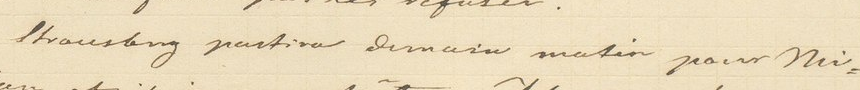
Strousberg partira demain matin pour Mi-
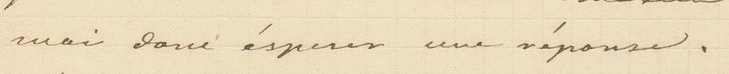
moi donc ésperer une réponse.
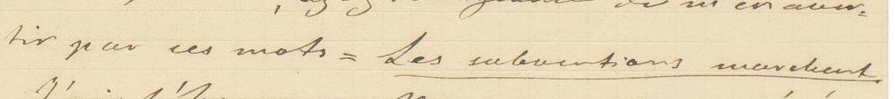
tir par ces mots «Les subventions marchent».
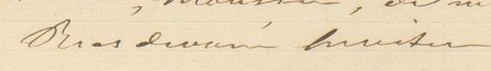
Tres devoué Serviteur
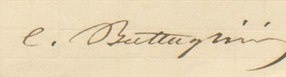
C. Battaglini
